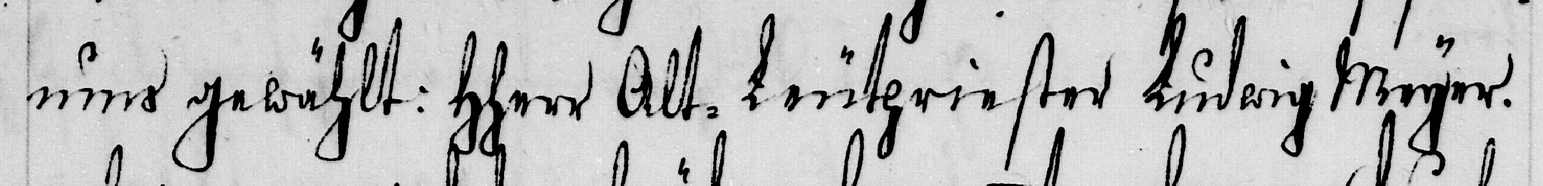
iums gewählt: HHerr Alt-Leutpriester Ludwig Meyer.
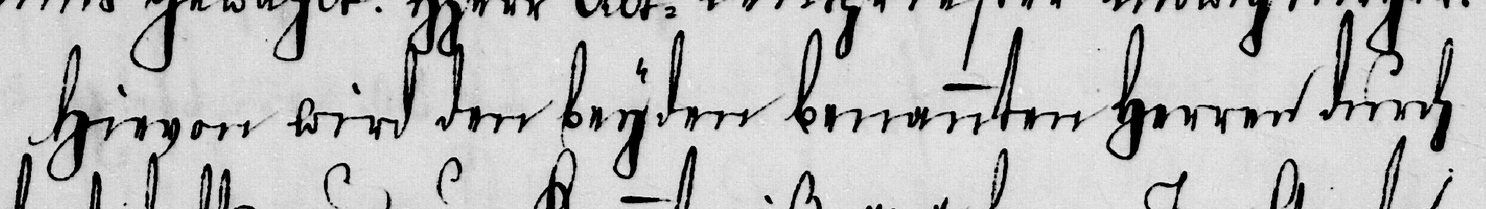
Hievon wird den beyden benannten Herren durch
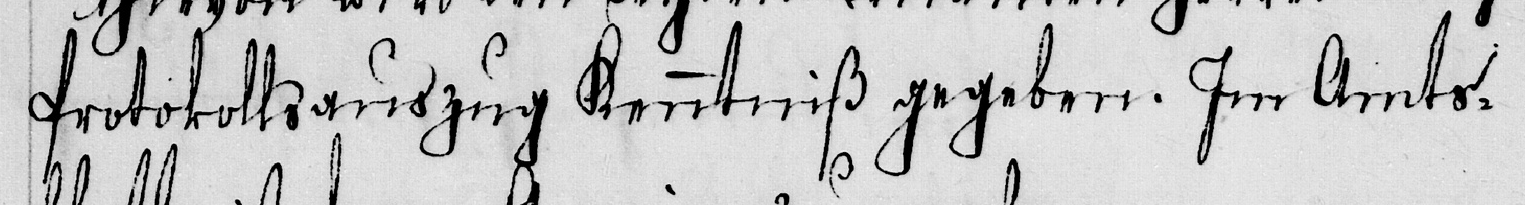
Protokollsauszug Kenntniß gegeben. Im Amts¬
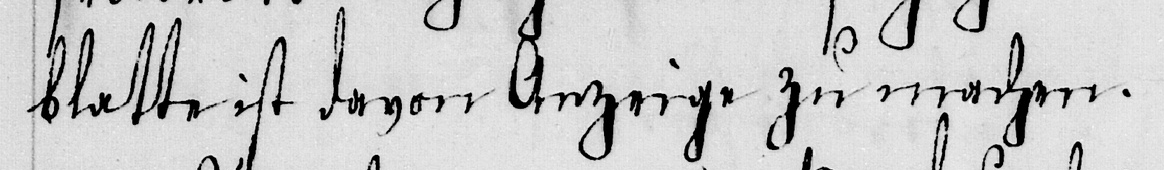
blatte ist davon Anzeige zu machen.
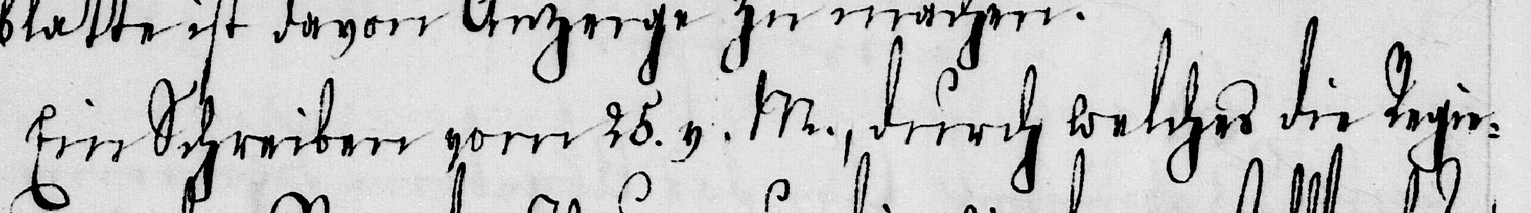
Ein Schreiben vom 25. d. M., durch welches die Regie¬
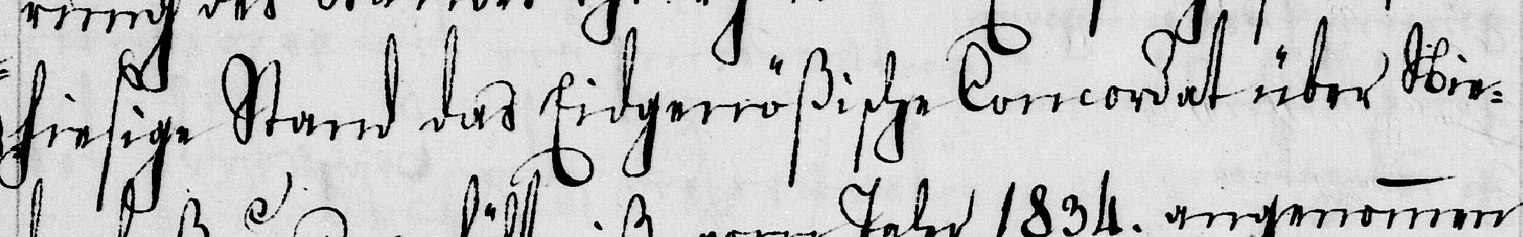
hiesige Stand das Eidgenößische Concordat über Nie¬
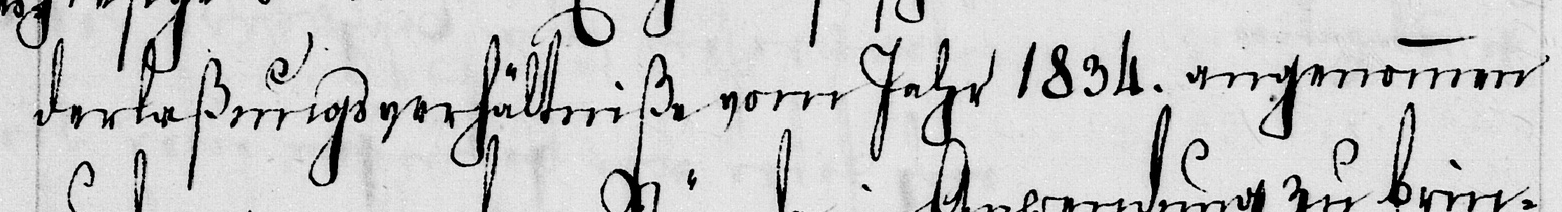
derlaßungsverhältniße vom Jahr 1834. angenommen
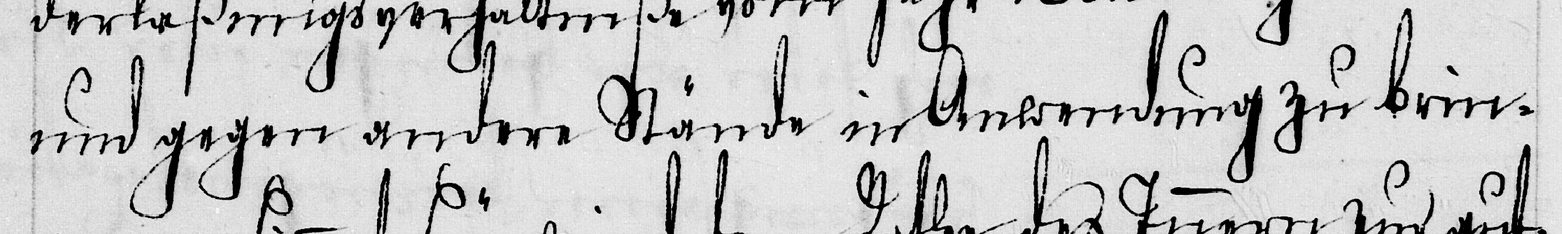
und gegen andere Stände in Anwendung zu brin¬
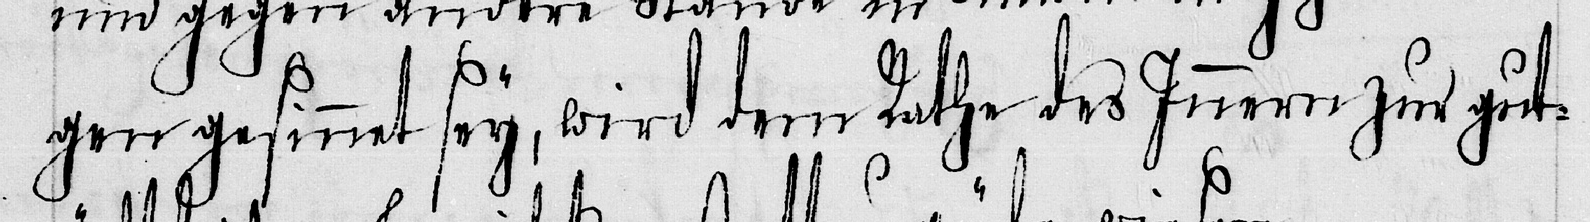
gen gesinnet sey, wird dem Rathe des Innern zur gut¬
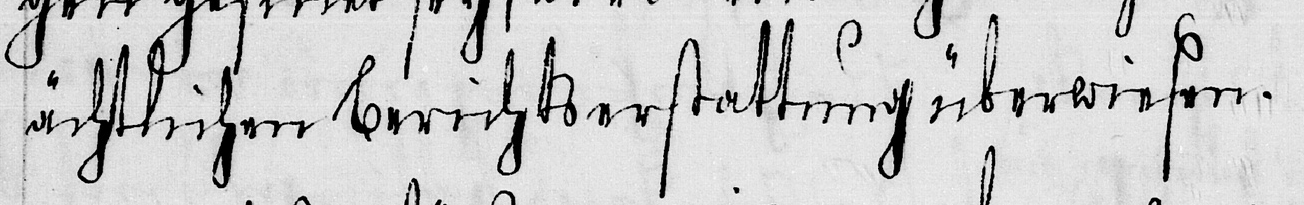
ächtlichen Berichterstattung überwiesen.
